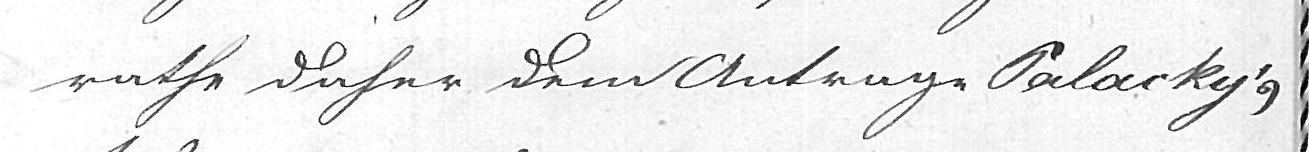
rathe daher dem Antrage Palacky's
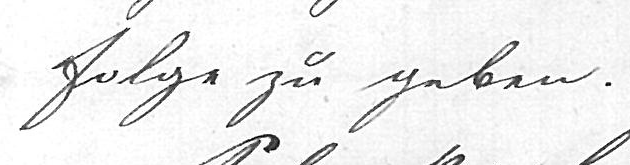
Folge zu geben.
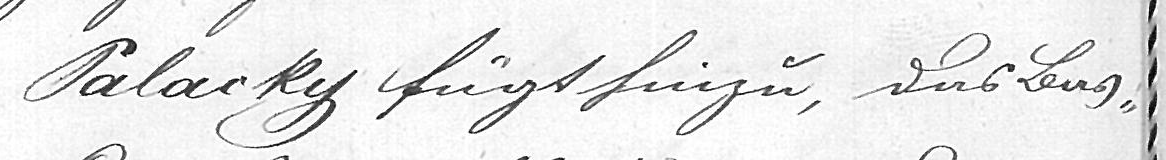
Palacky fügt hinzu, das Bas-
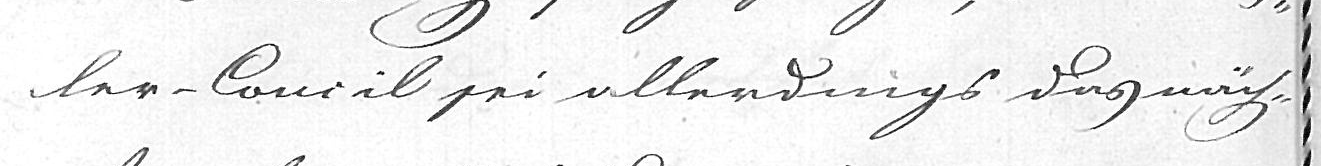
ler-Concil sei allerdings das näch-
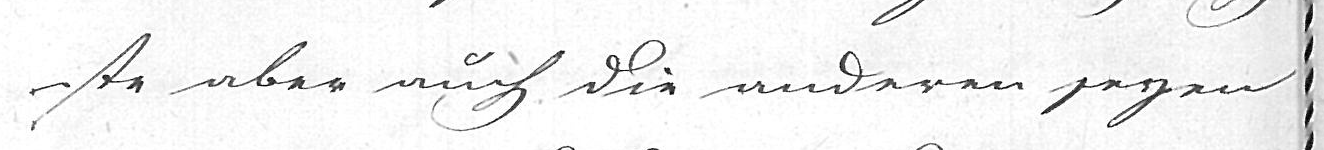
ste aber auch die anderen seyen
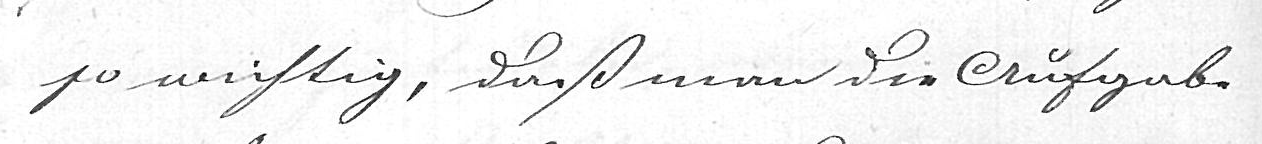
so wichtig, daß man die Aufgabe
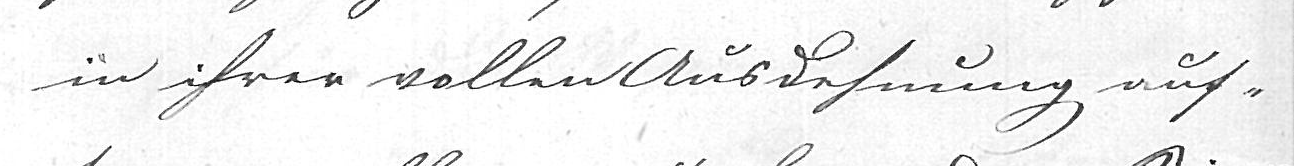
in ihrer vollen Ausdehnung auf-
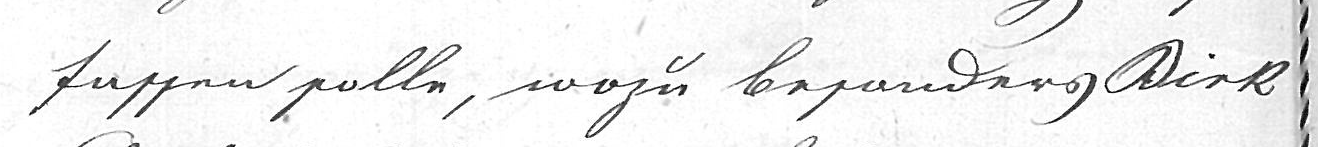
fassen solle, wozu besonders Birk
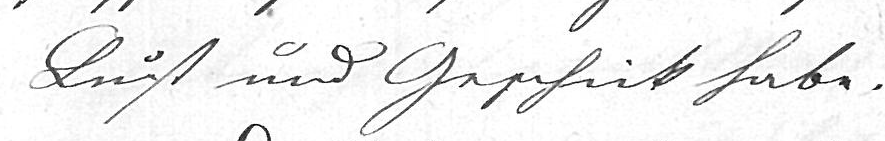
Lust und Geschick habe.
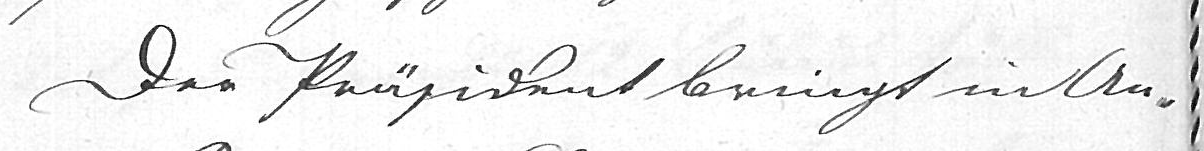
Der Präsident bringt in An-
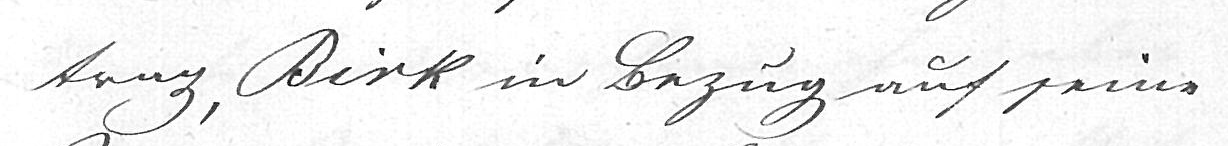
trag, Birk in Bezug auf seine
